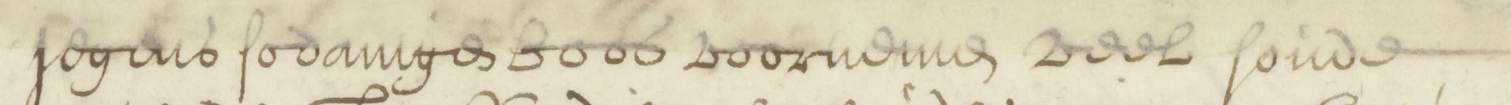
jegens sodanigen boos voornemen veel soude
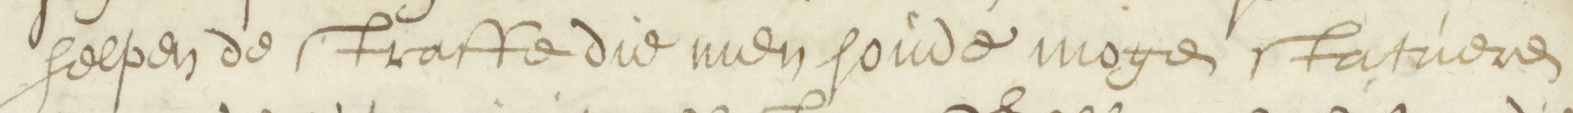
helpen de straffe die men soude mogen statueren
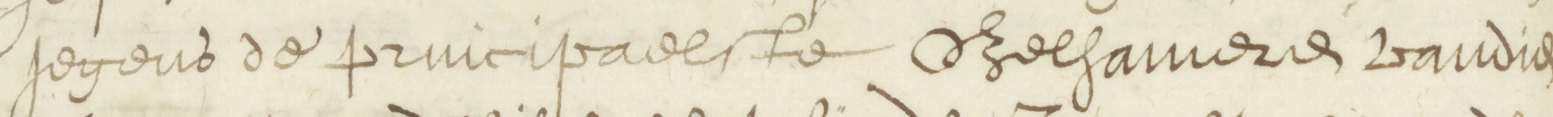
jegens de principaelste Belhameren vandien
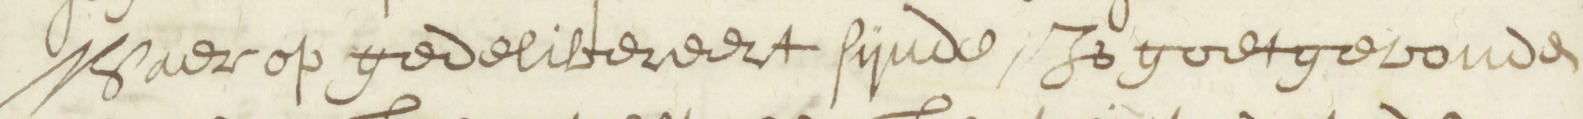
Waerop gedelibereert sijnde, Is goetgevonden
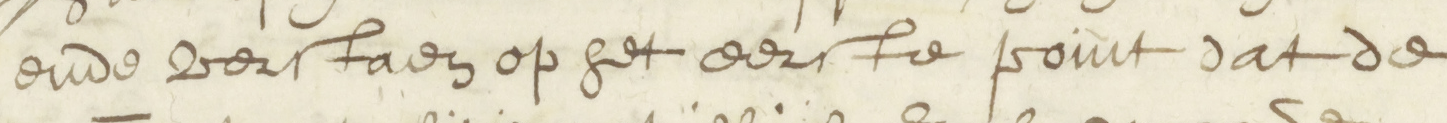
ende verstaen op het eerste point dat de
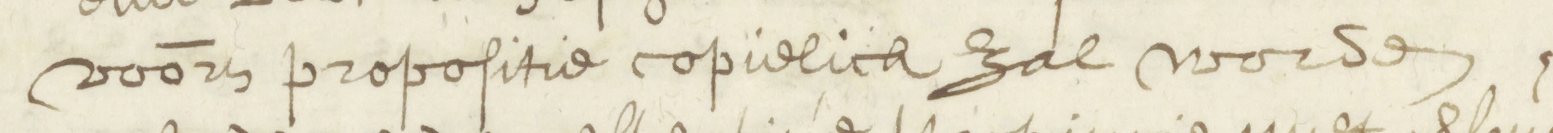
voorn propositie copielick zal worden
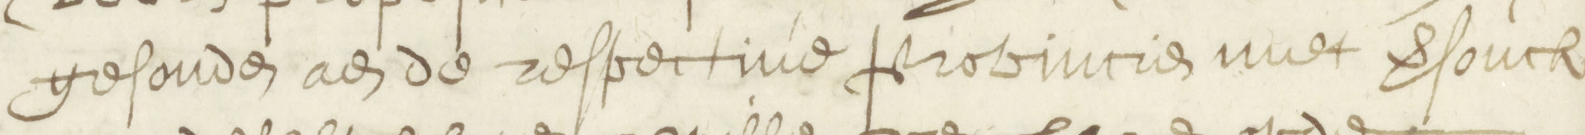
gesonden aen de respectiue Provincien met vsouck
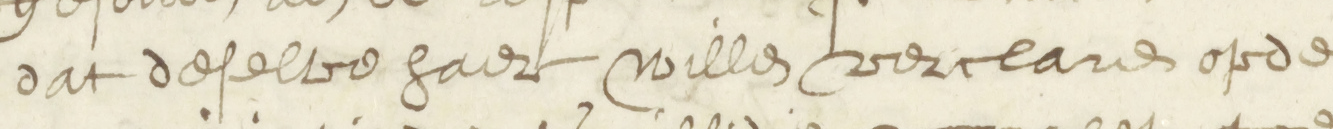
dat deselve haer willen verclaren opde
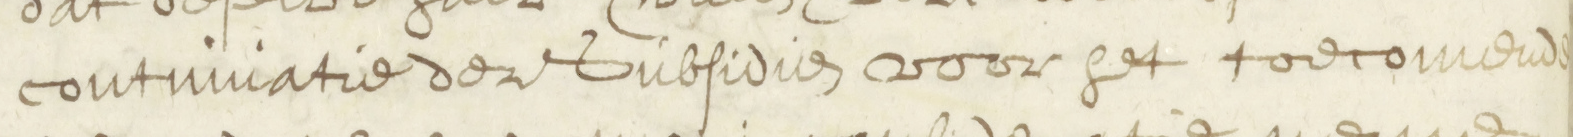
continuatie der Subsidien voor het toecomende
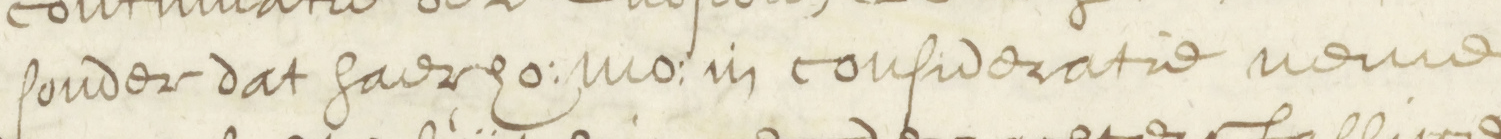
sonder dat haer ho:Mo: in consideratie nemen
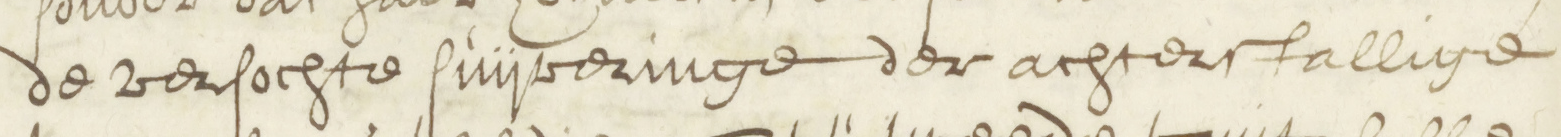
de versochte suijveringe der achterstallige
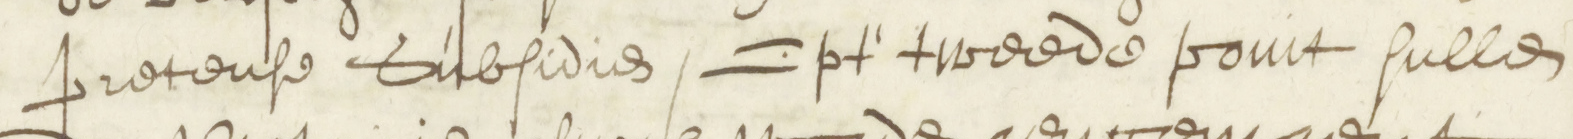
pretense Subsidien, Opt' tweede point sullen
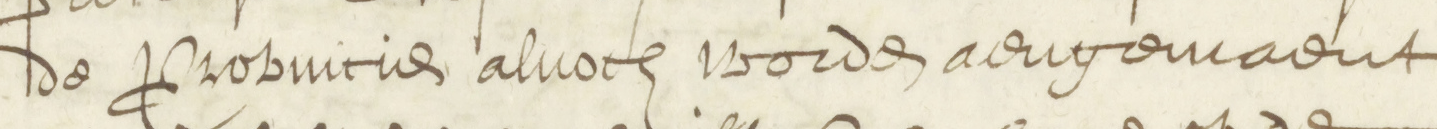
de Provincien alnoch worden aengemaent
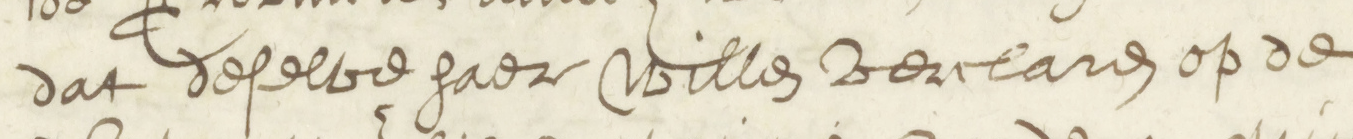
dat deselve haer willen verclaren op de
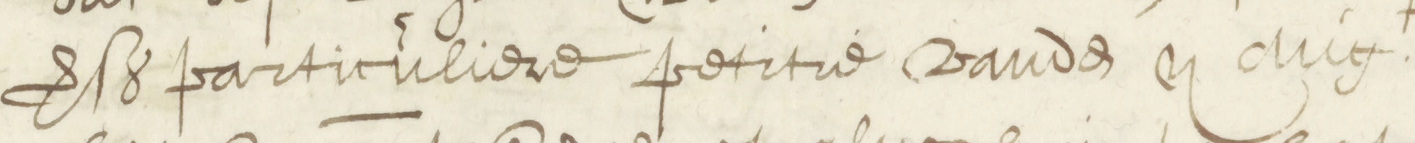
vs particuliere petitie vanden ij augti
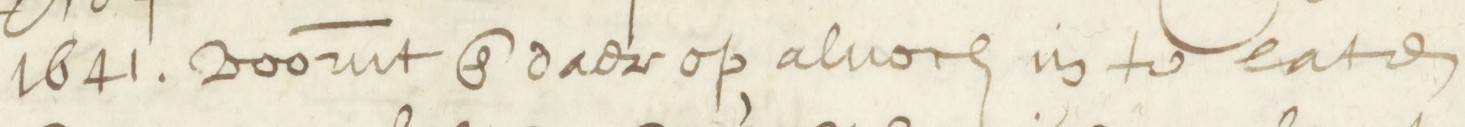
1641. voornt & daer op alnoch in te laten
